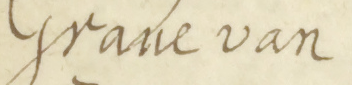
Grave van
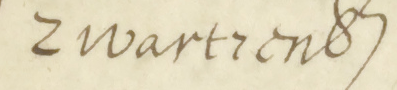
Zwartzenb
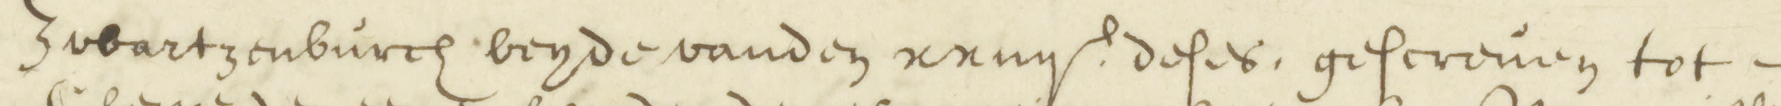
Zwartzenburch beyde vanden xxiiije deses, gescreuen tot
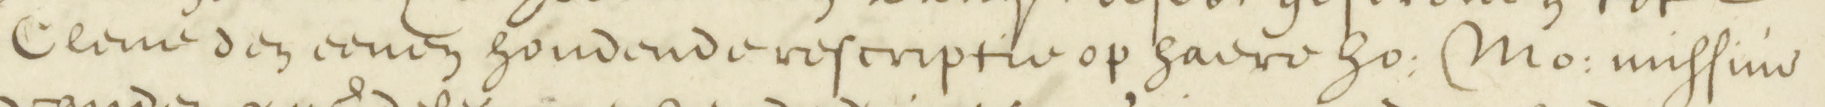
Cleve den eenen houdende rescriptie op haere Ho:Mo: missive
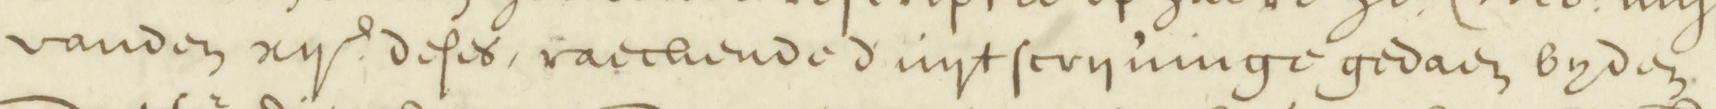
vanden xije deses, raeckende d'uytscrijuinge gedaen byden
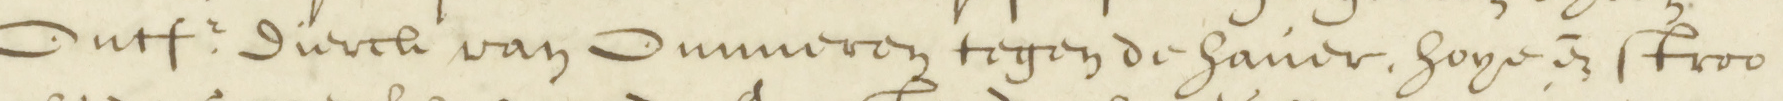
Ontfr Dierck van Ommeren tegen de hauer, hoye en stroo
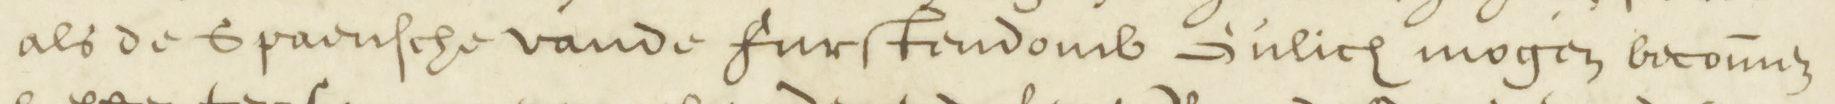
als de Spaensche vande furstendomb Gulich mogen becomen
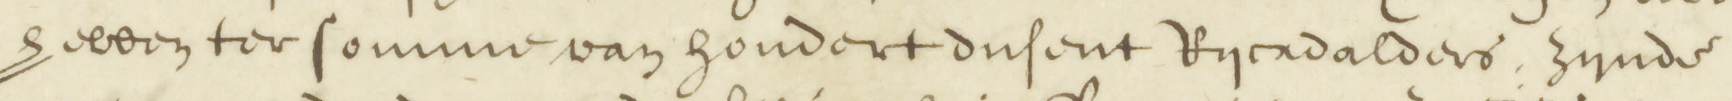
hebben, ter somme van hondert dusent Rycxdalders zynde
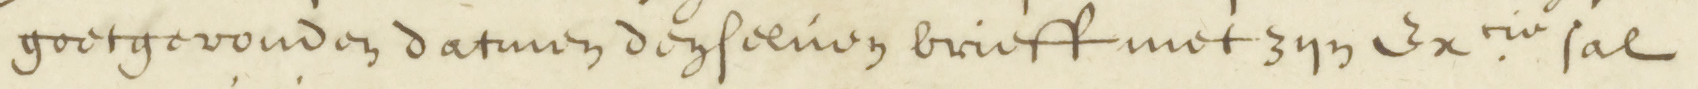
goetgevonden datmen denseluen brieff met zijn Excie sal
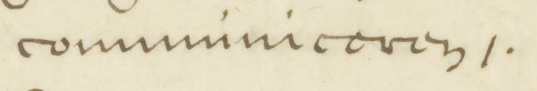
communiceren.
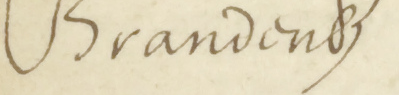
Brandenb
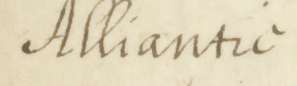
Alliantie
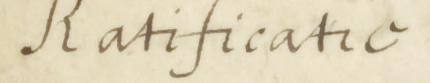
Ratificatie
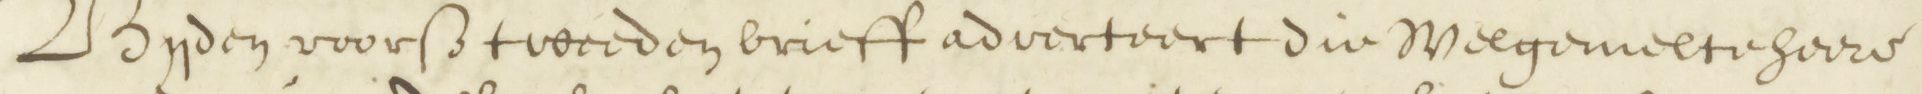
Bijden voors tweeden brieff adverteert die Welgemelte heere
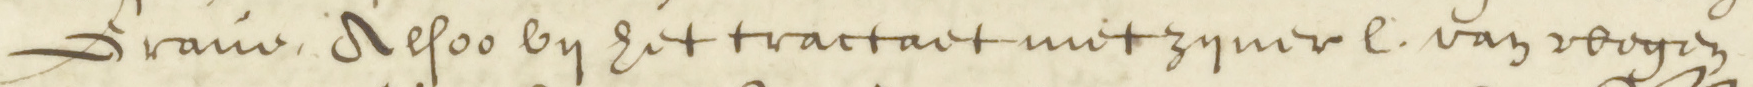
Graue, Alsoo by het tractaet met zyner L. van wegen
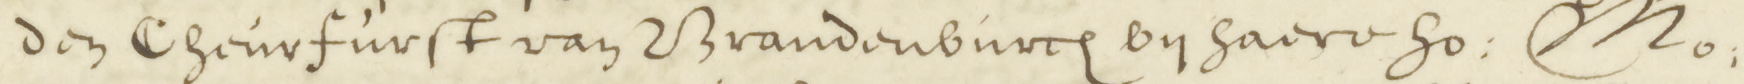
den Cheurfurst van Brandenburch by haere Ho:Mo:
